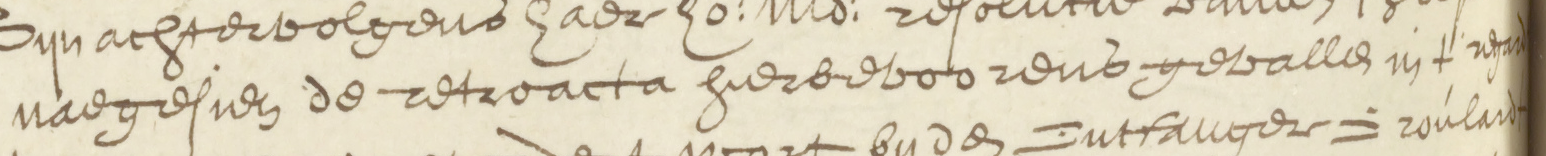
naegesien de retroacta hierbevoorens gevallen in t‛rega
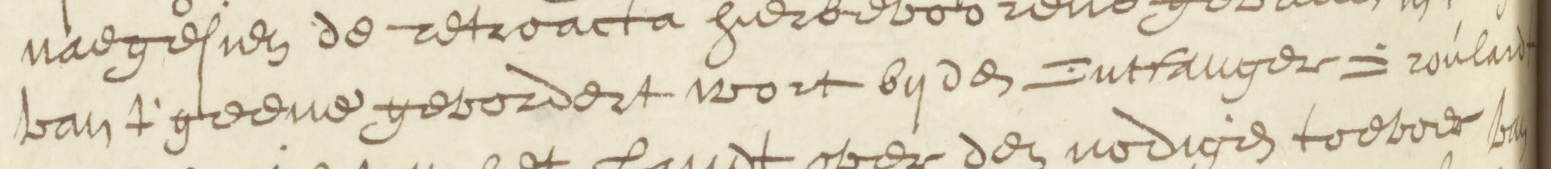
van t'geene gevordert wort by den Ontfanger Groulic
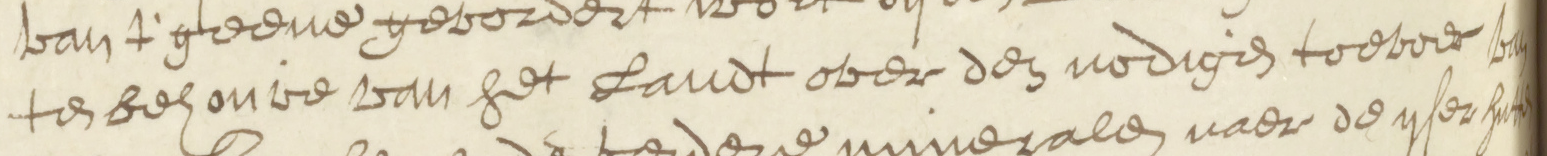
ten behouve van het Landt over den nodigen toevoer van
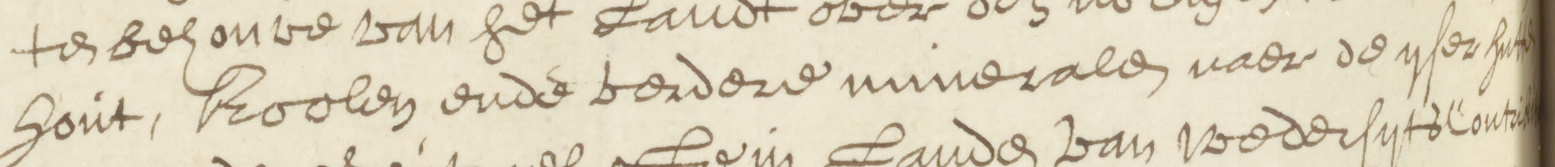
hout, Koolen ende verdere mineralen naer de ijserha
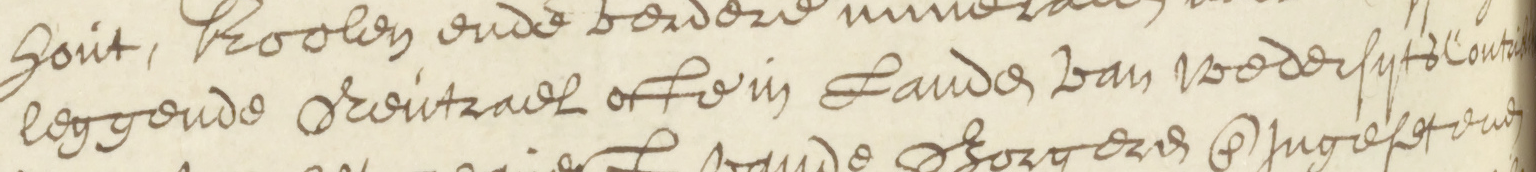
leggende Neutrael ofte in Landen van wedersyts Conte
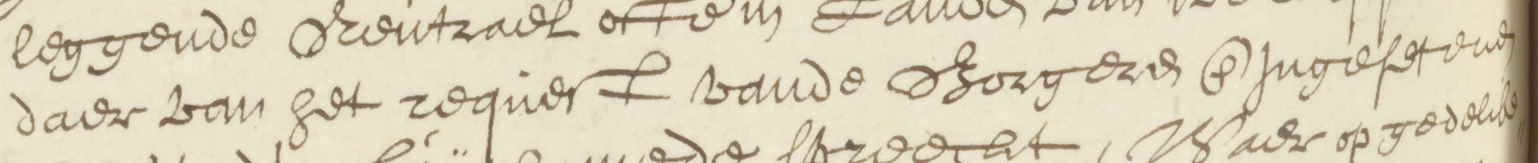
daer van het request vande Borgeren & Ingesetenen
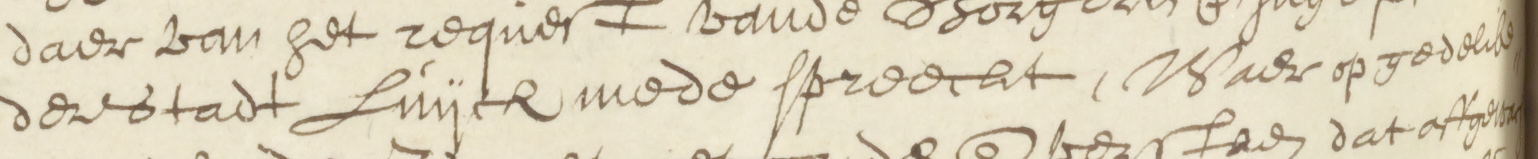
der stadt Luijck mede spreeckt. Waer op gedelibe„
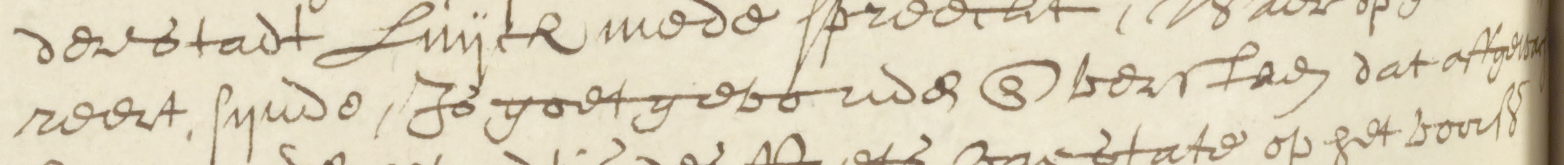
reert synde, Is goetgevonden & verstaen dat affgesr
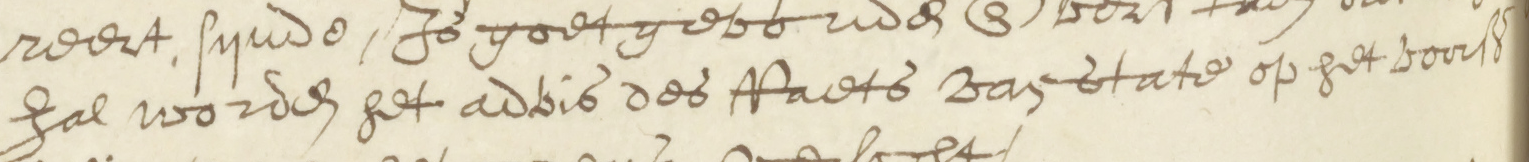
zal worden het advis des Raets van State op het voors
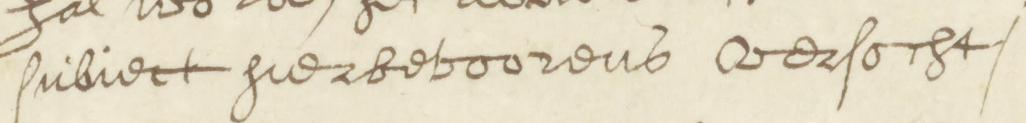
subject hierbevoorens, versocht.
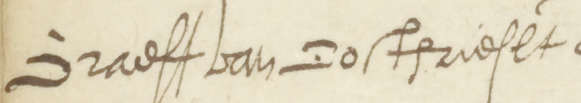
Graeff van Oostfrieslt
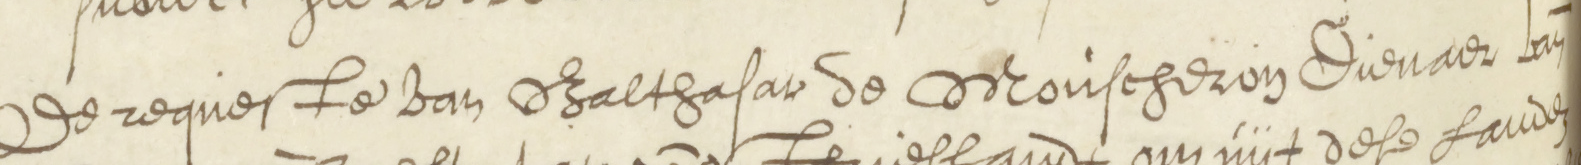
De requeste van Balthasar de Mouscheron Dienaer van
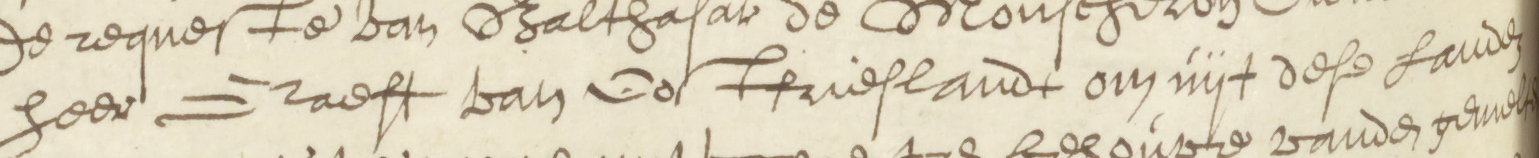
heer Graeff van Oostfrieslandt om uijt dese Landen
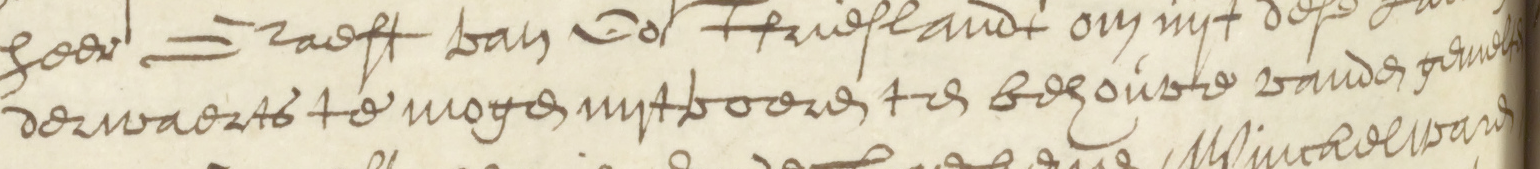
derwaerts te mogen uytvoeren ten behouve vanden gemelte
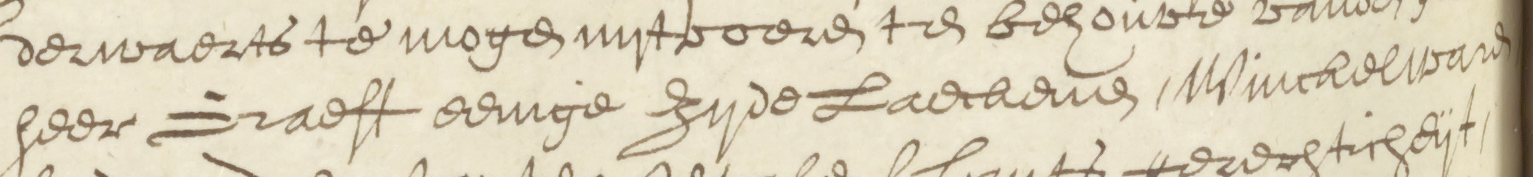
heer Graeff eenige zyde Laeckenen, Winckelwaren
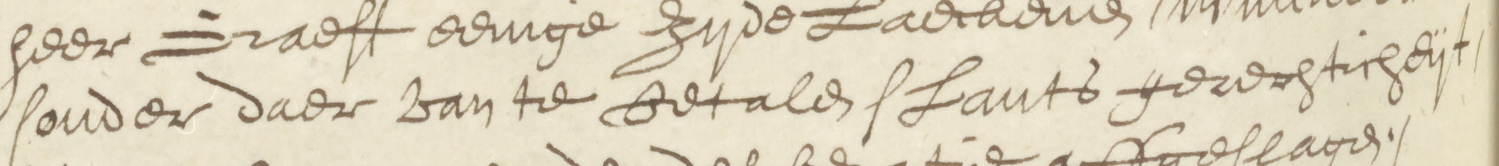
sonder daer van te betalen sLants gerechticheijt,
